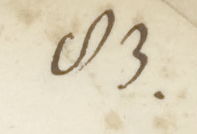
83.
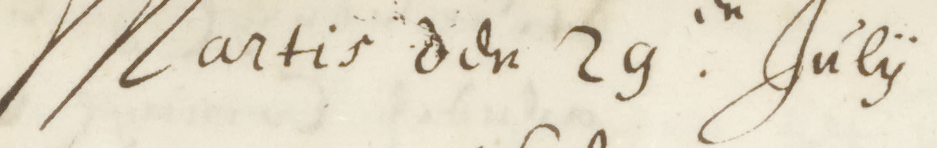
Martis der 29en. Julij
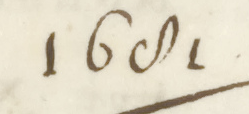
1681
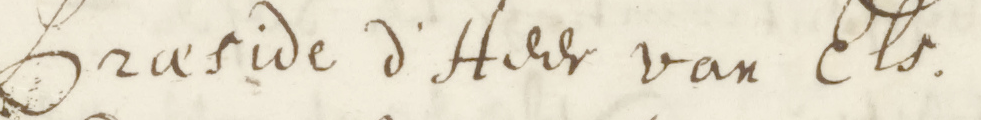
Præside d'Heer van Els.
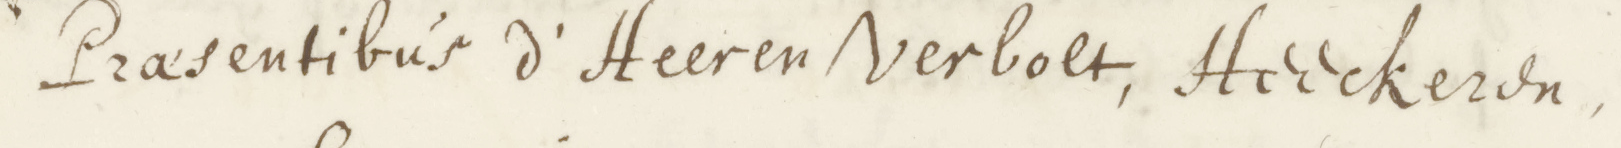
Præsentibus d'Heeren Verbolt, Heeckeren,
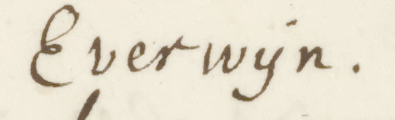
Everwijn.
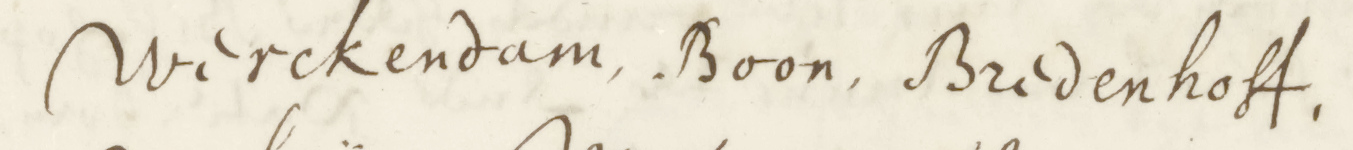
Werckendam, Boon, Bredenhoff,
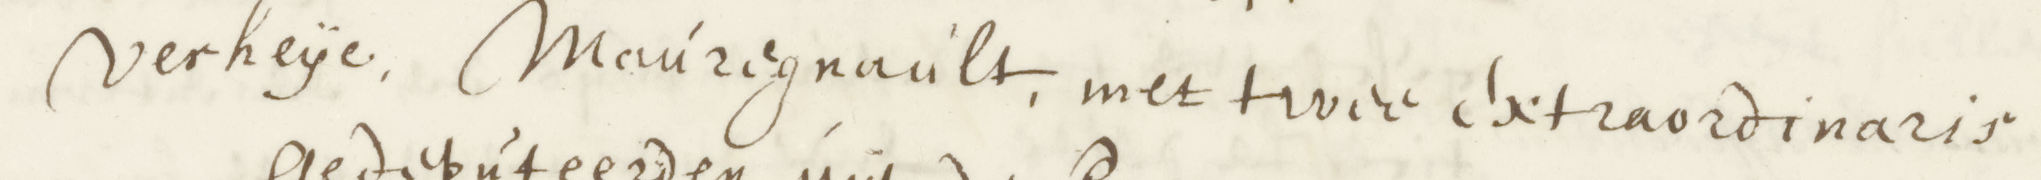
Verheije, Mauregnault, met twee Extraordinaris
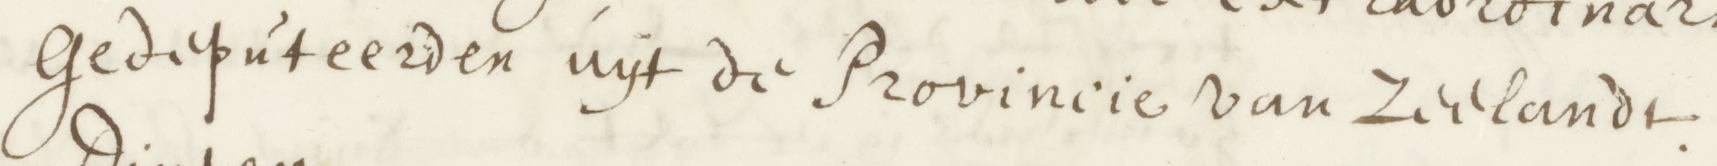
Gedeputeerden uijt de Provincie van Zeelandt.
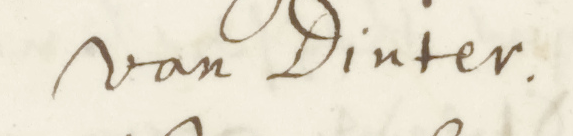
van Dinter.
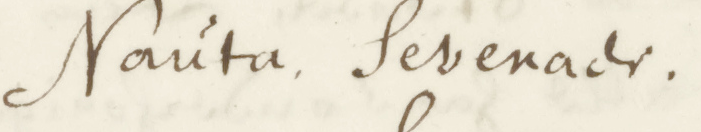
Nauta, Sevenaer.
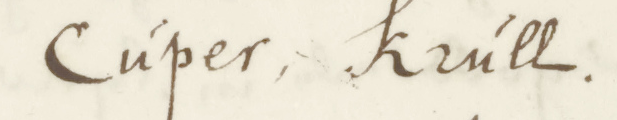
Cuper, Krull.
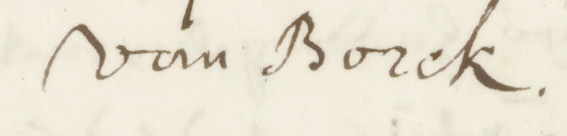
van Borck.
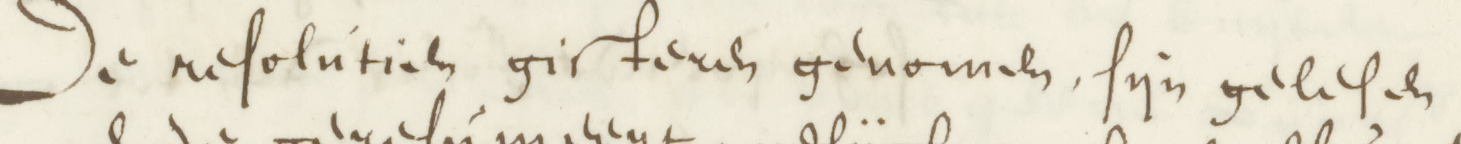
De resolutien gisteren genomen, sijn gelesen
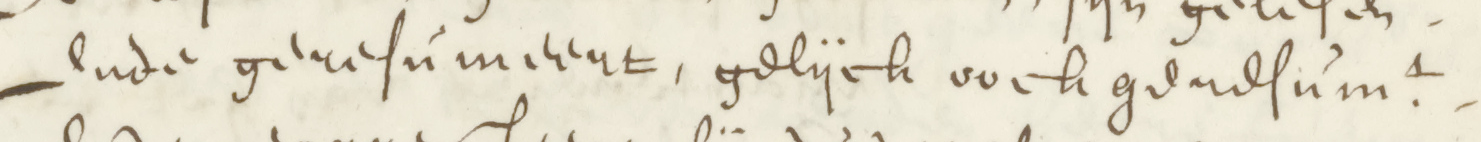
ende geresumeert, gelijck oock geresumt.
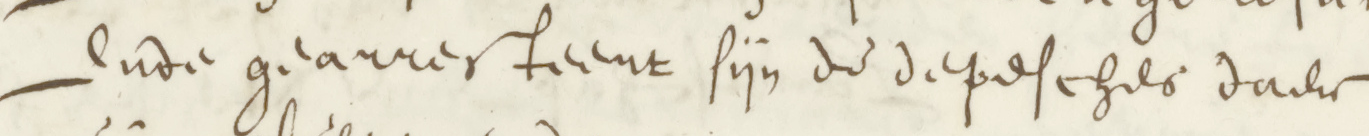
ende gearresteert sijn de depesches daer
